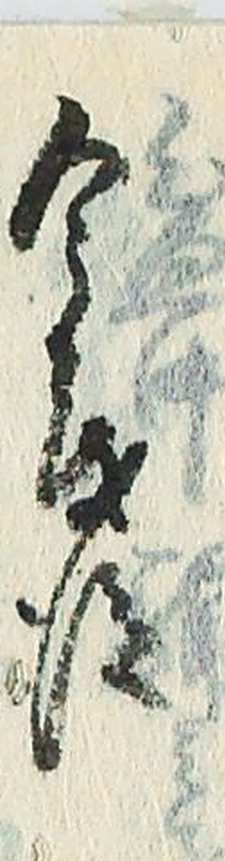今度従
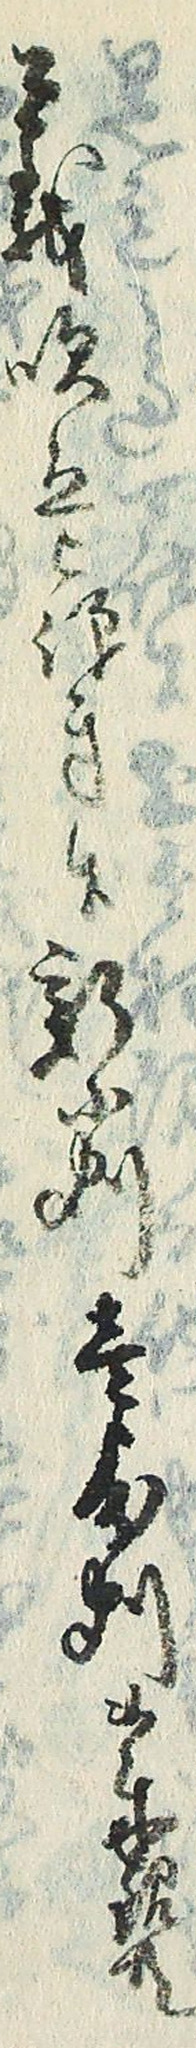公義吹立被仰付候新小判壱歩判弐朱銀共
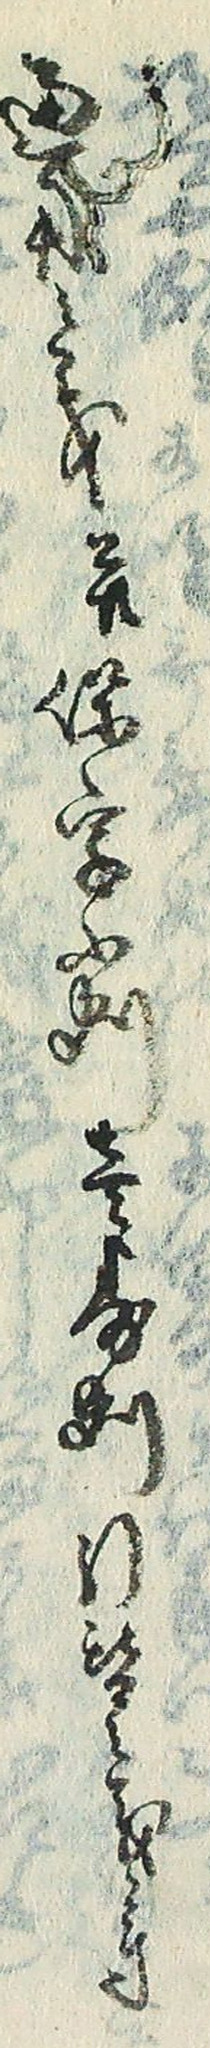通用之義幷保字小判壱歩判引替之義に付
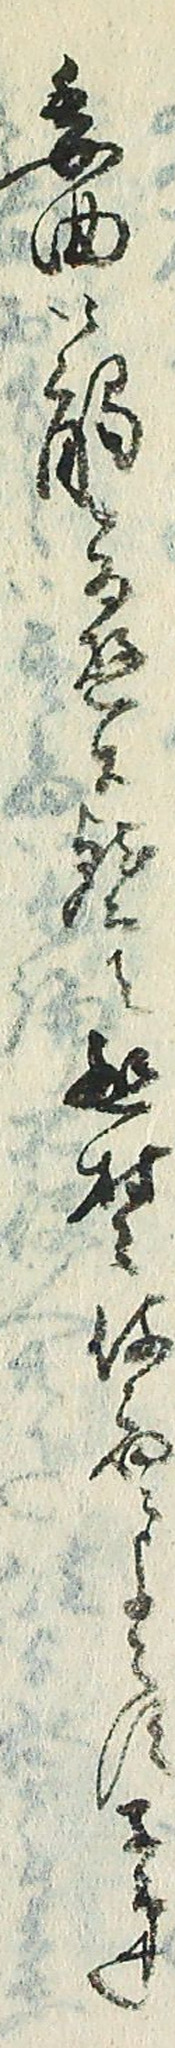委曲御触被為遊候就而は組村々何者によらす早速
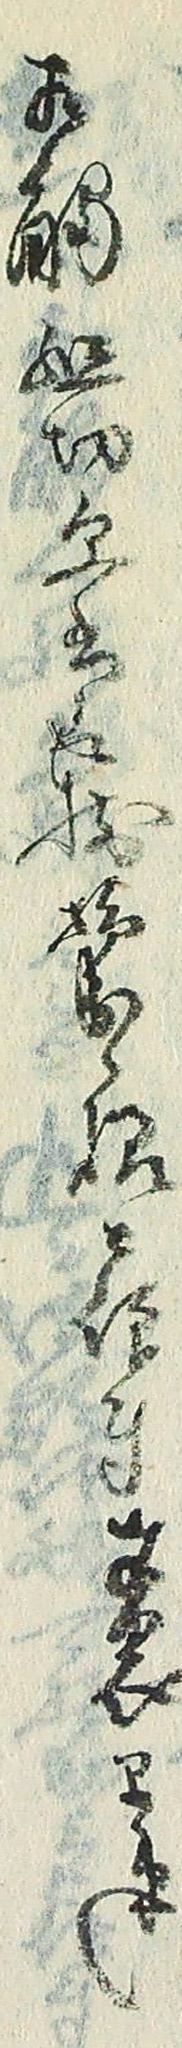相触組切受書取揃指出候様被仰付奉畏早速
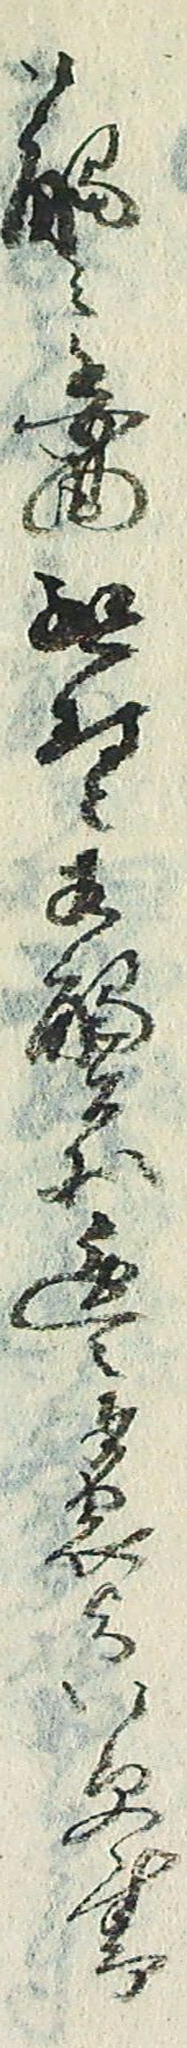御触之委曲組村々相触候処逸々奉畏旨御受書
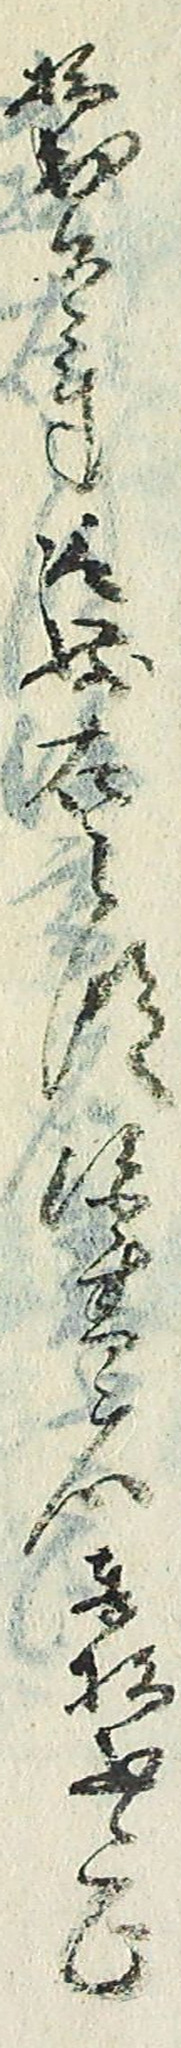指出候に付取揃右之段添書を以奉指出候以上
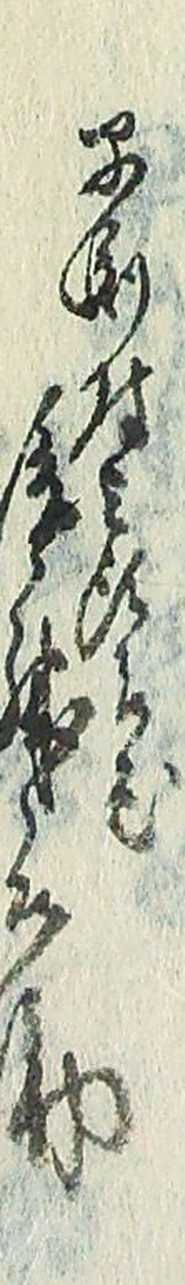早渕村与頭庄屋
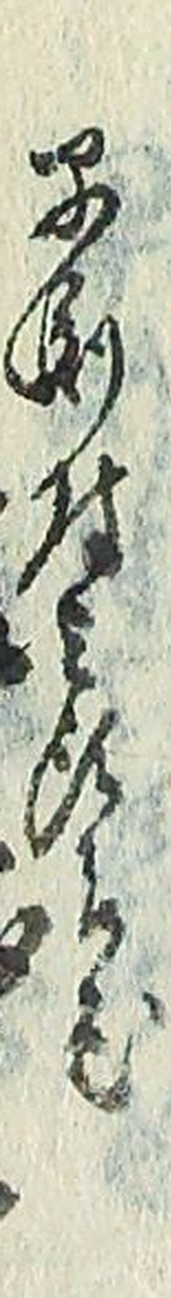早渕村与頭庄屋
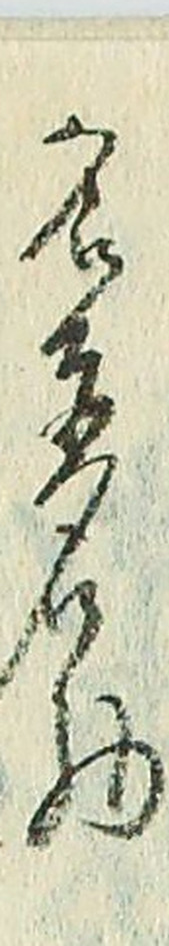名東名西
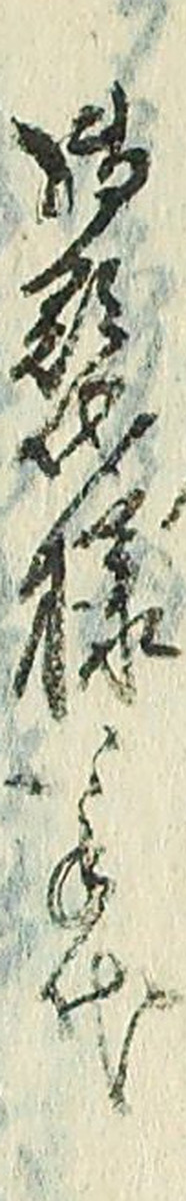御郡代様御手代
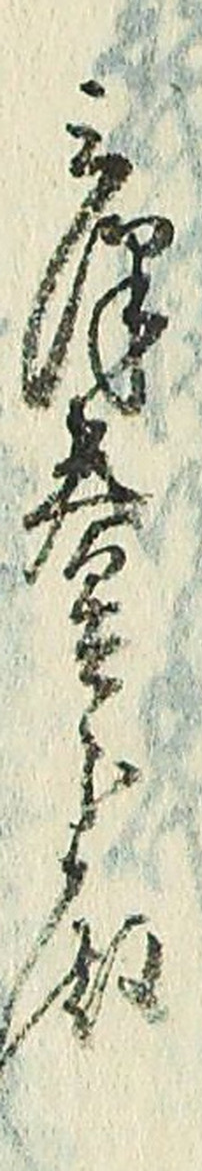三沢春太郎殿
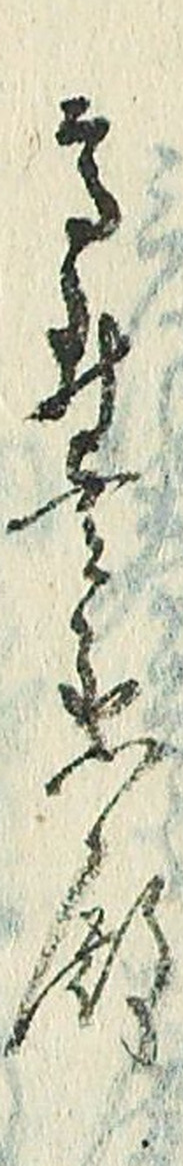高井与三兵衛殿
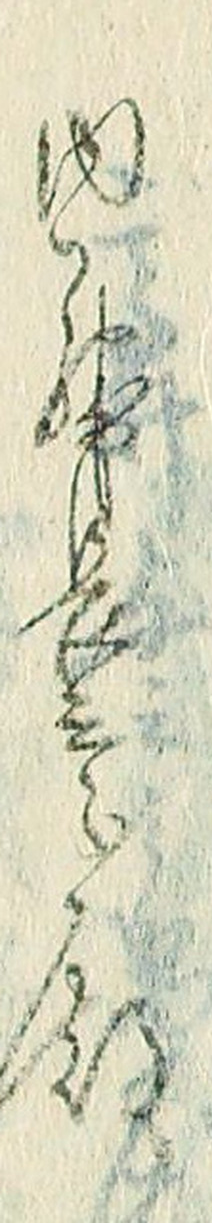内藤長三郎殿
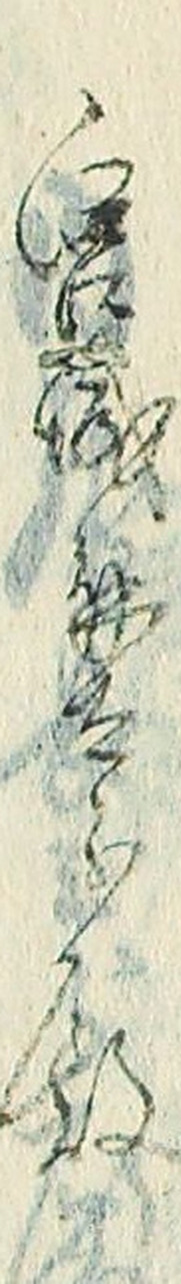宮城麻太郎殿

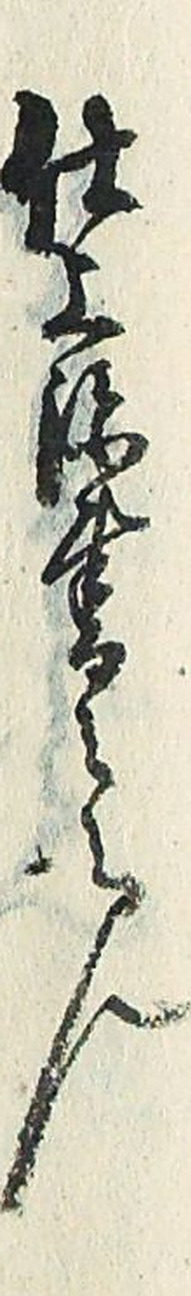仕上添書之覚
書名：諸御用御□受書控
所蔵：鳴門教育大学 Naruto University of Education
